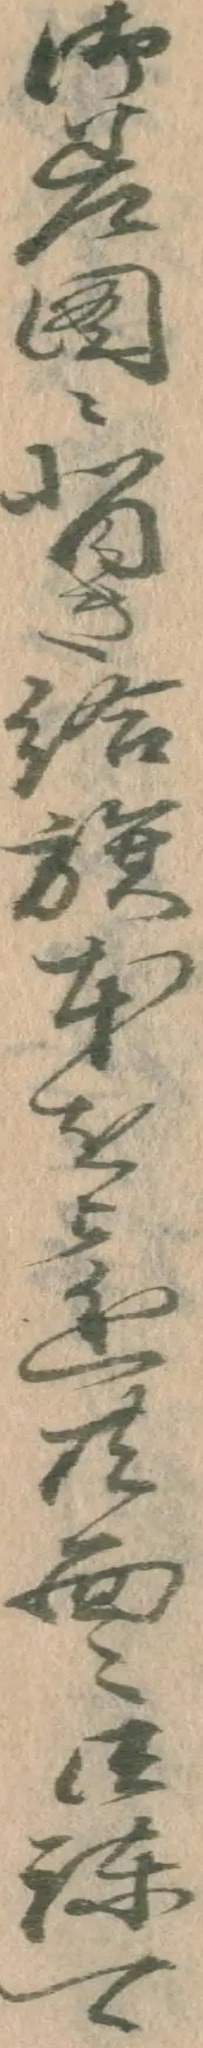御差図に背き給旗本を被進共面々御評可
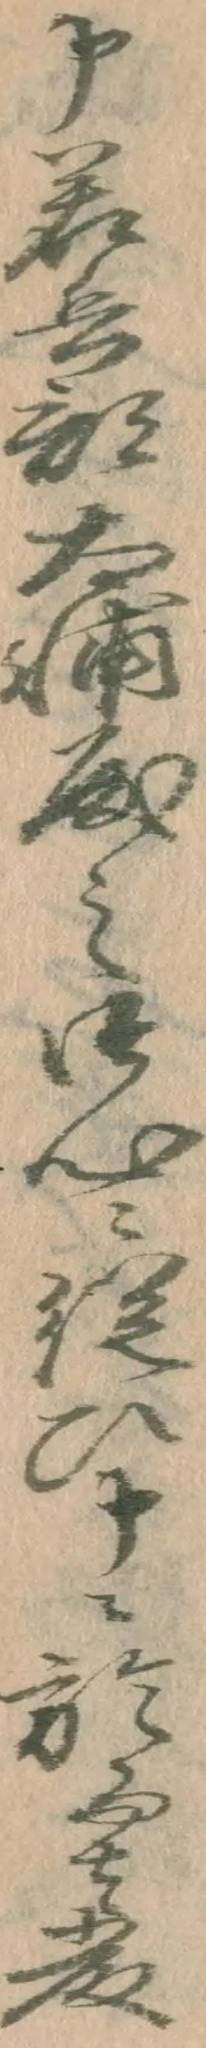申若兵部太輔殿之御心に従ひ申に於而者厳
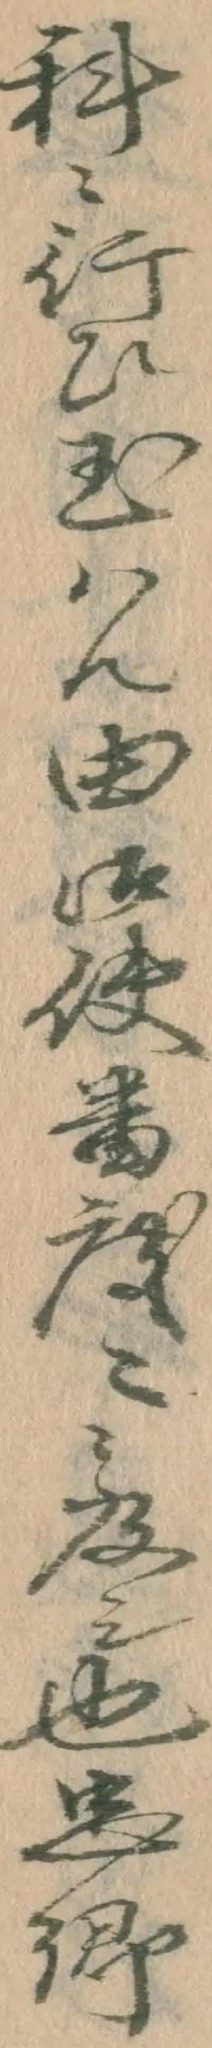科に行ひ至はん由御使番度々に及し也忠郷
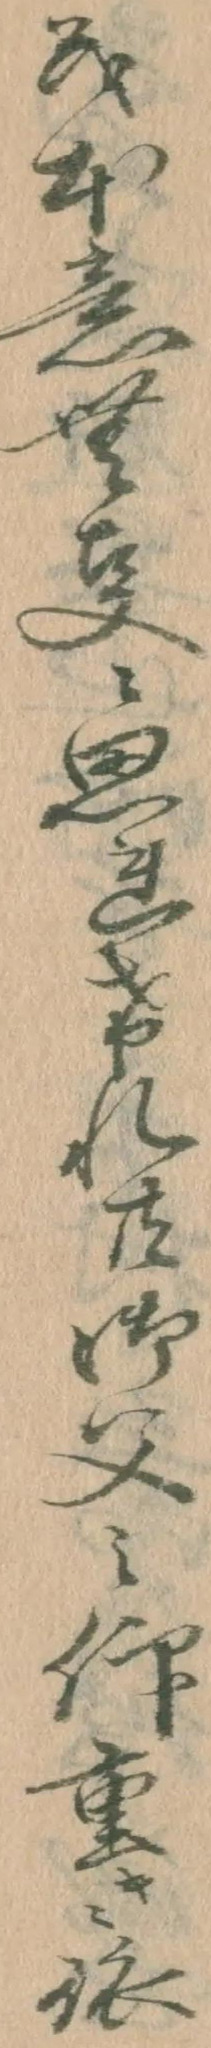茂本意無事に思連希れ共御父之仰重きに寄
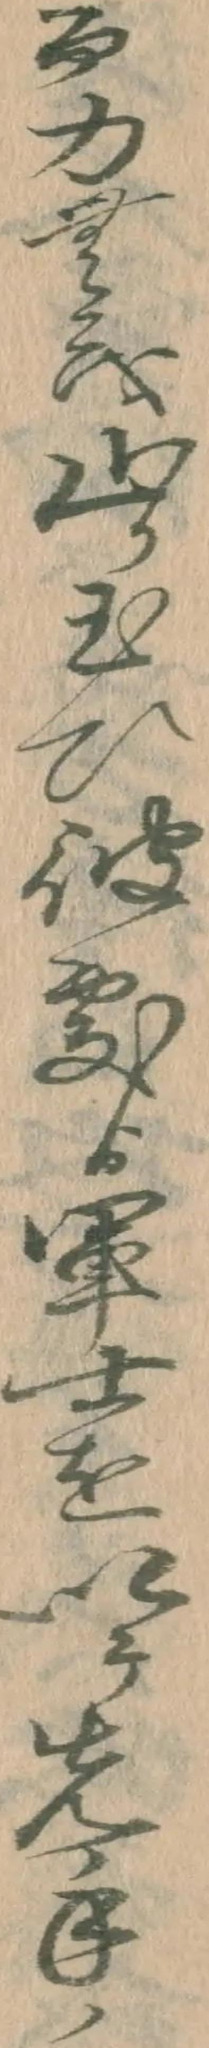而力無茂止り至ひ彼處ゟ軍士を以て先手之
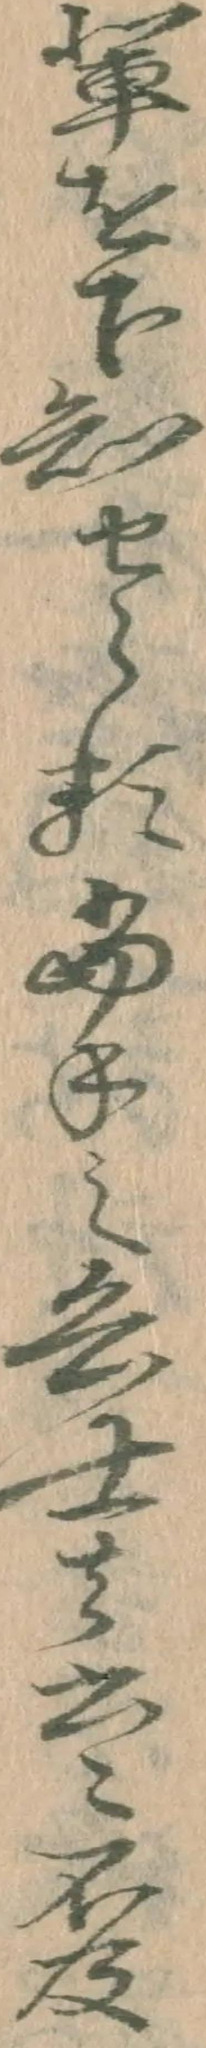輩を下知せら類当手之兵士者云に不及
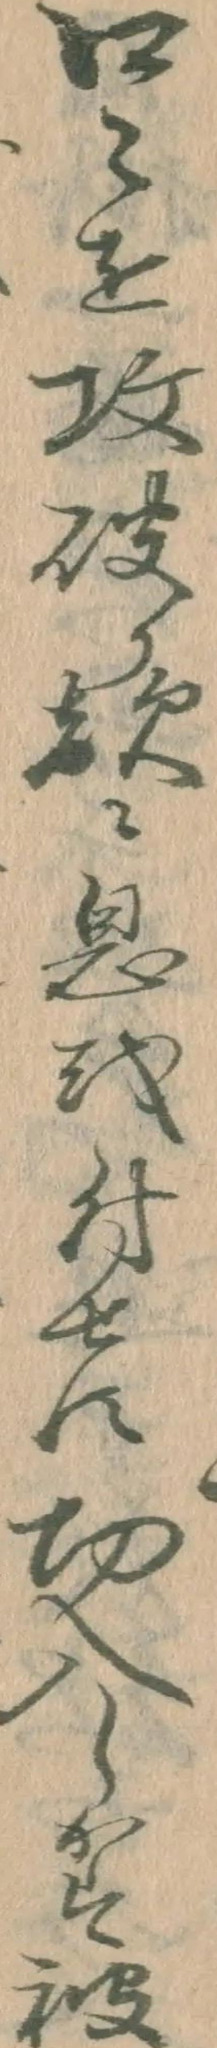口々を攻破り敵に息越付せ須切入しかは被
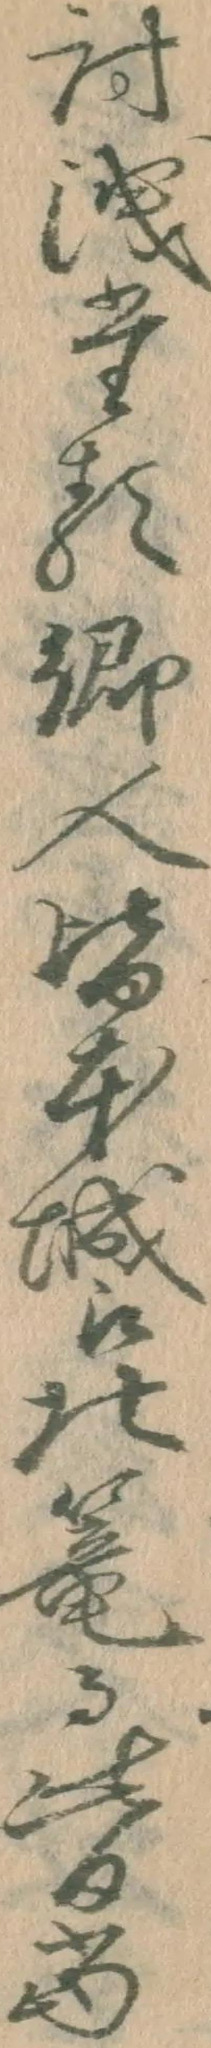討洩堂類郷人皆本城江比篭る此日当
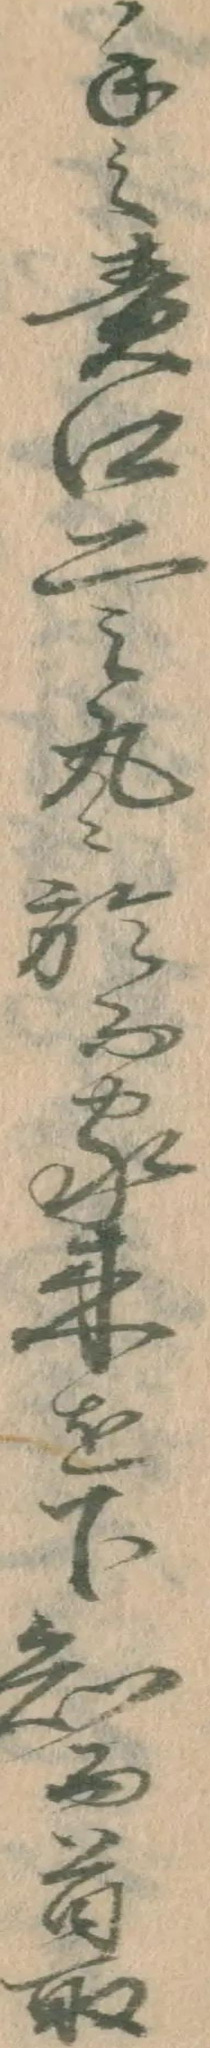手之責口二之丸に於而家来を下知而首取
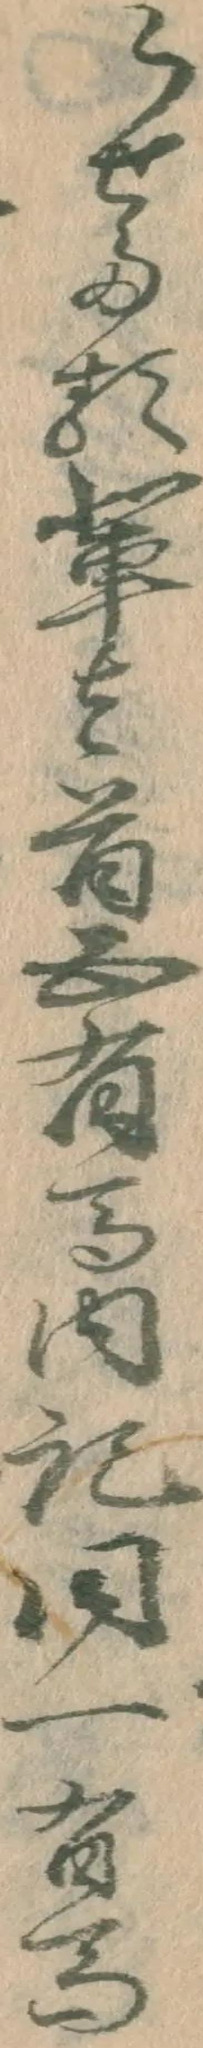らせ多類輩を首五有馬内記同一有馬
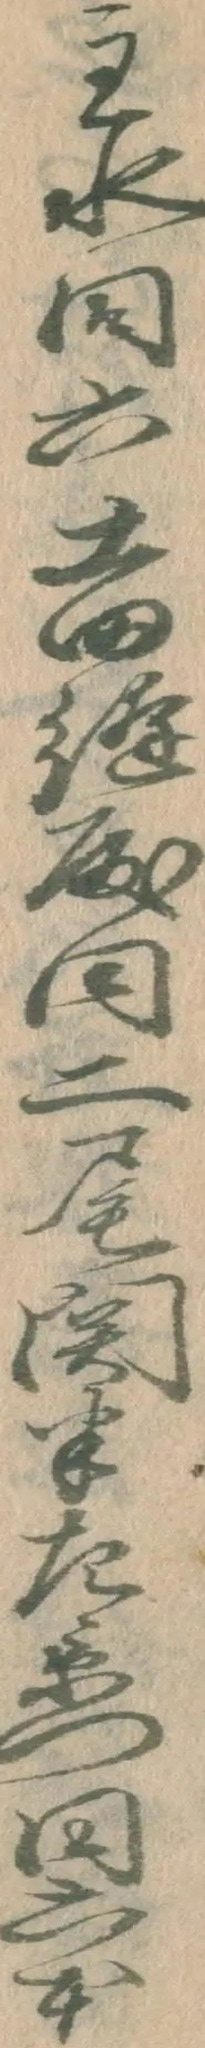主水同六土田縫殿同二尾関半左衛門同六本
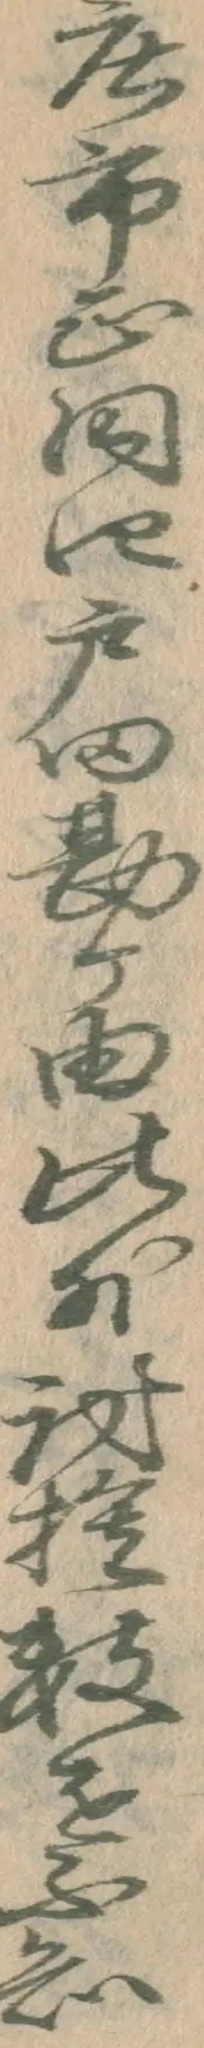庄市正同四戸田勘け由此外討捨数をふ知
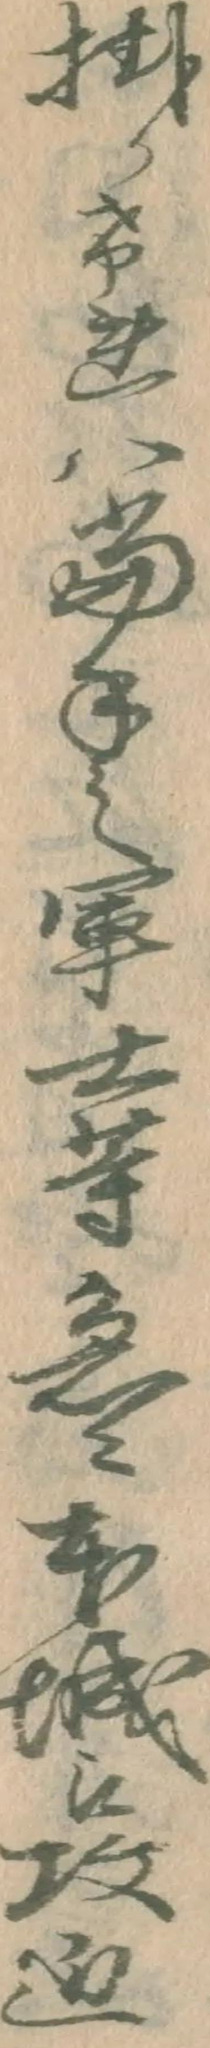掛り希連は当手之軍士等九急に本城江攻近
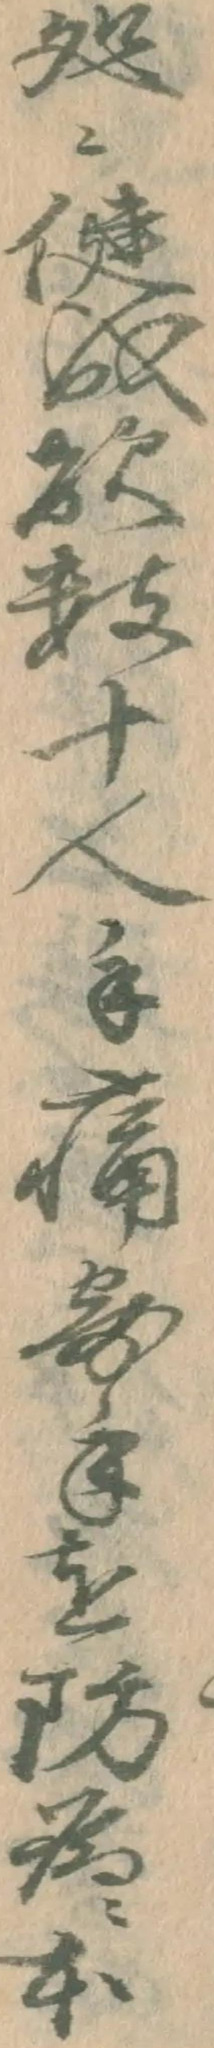処に健成敵数十人手痛寄手を防為に本

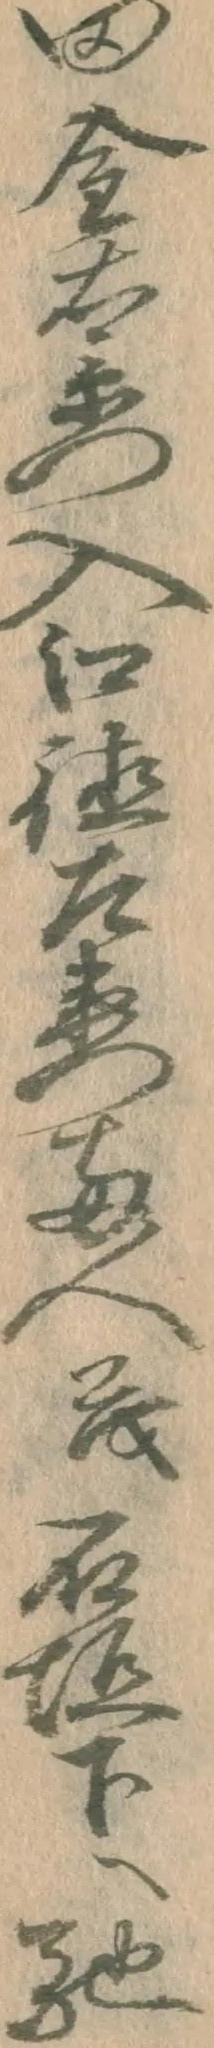田金右衛門入江徳左衛門両人茂石垣下へ馳
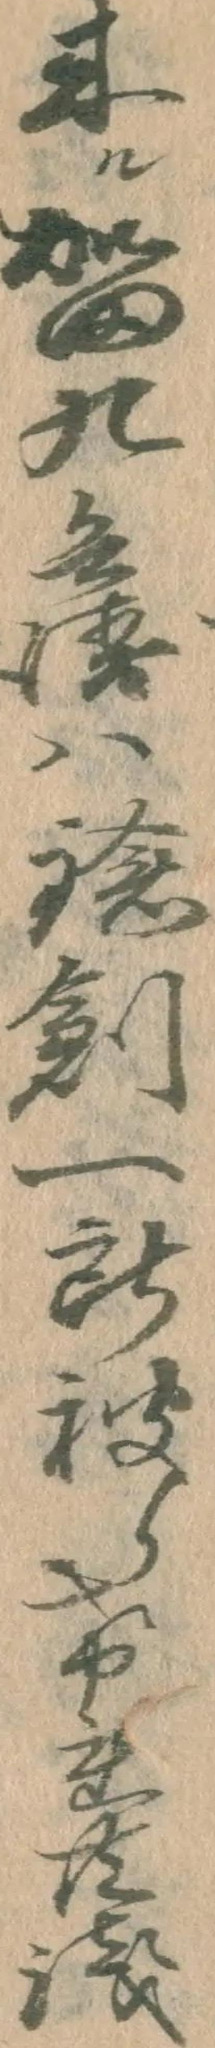来る加田九兵衛は鎗創一所被り希連共浅
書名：切支丹御退治記 49巻. [8]
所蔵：国立国会図書館 National Diet Library, JAPAN
